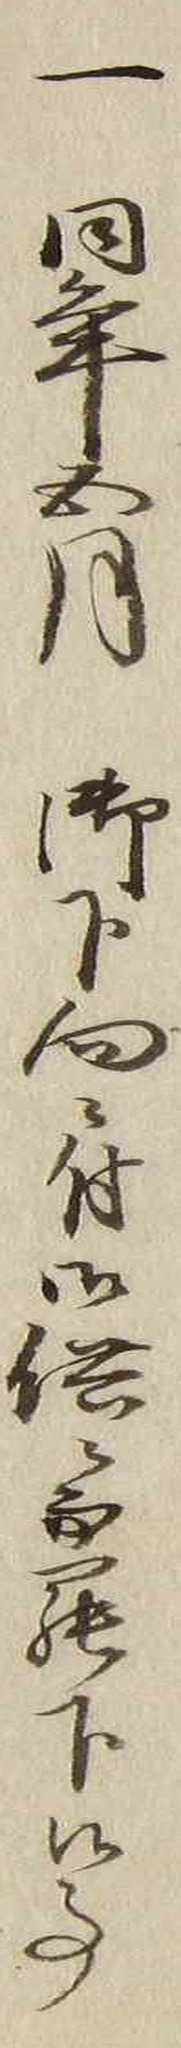一同年五月御下向ニ付御供ニ而罷下候事
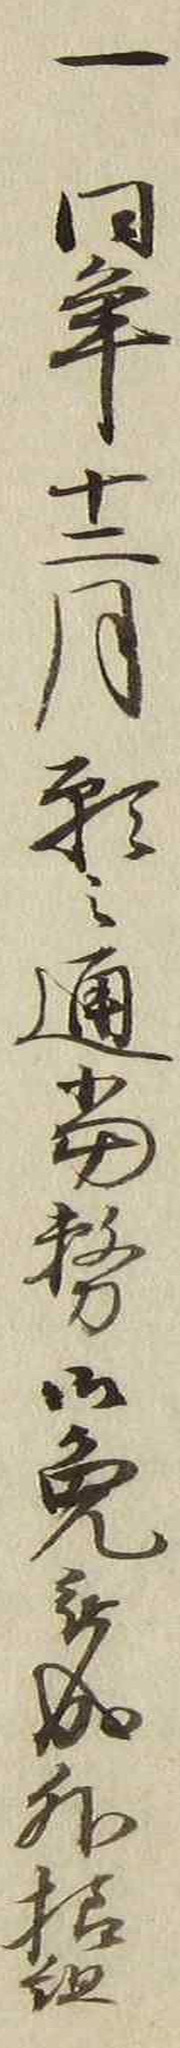一同年十二月願之通当務御免被成外様組
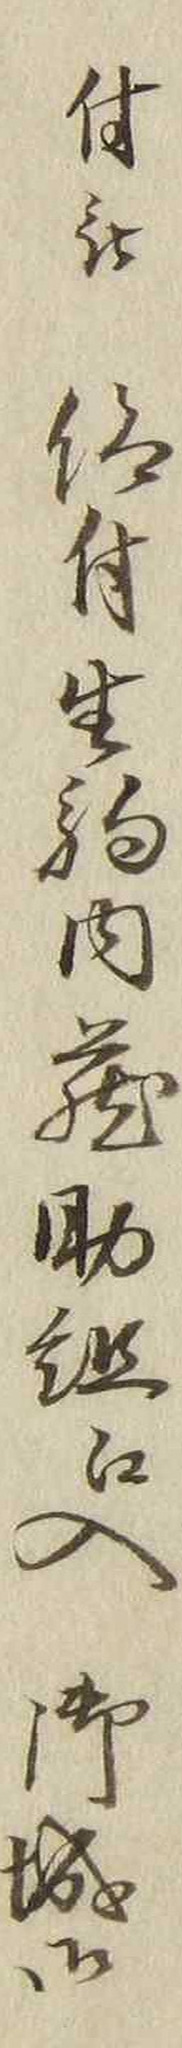付被仰付生駒内蔵助組江入御城御
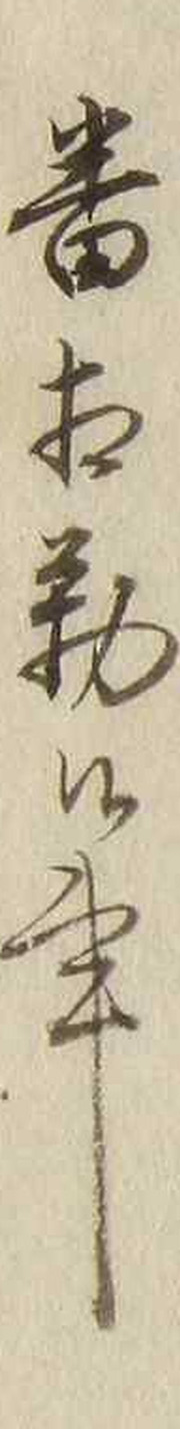番相勤候事

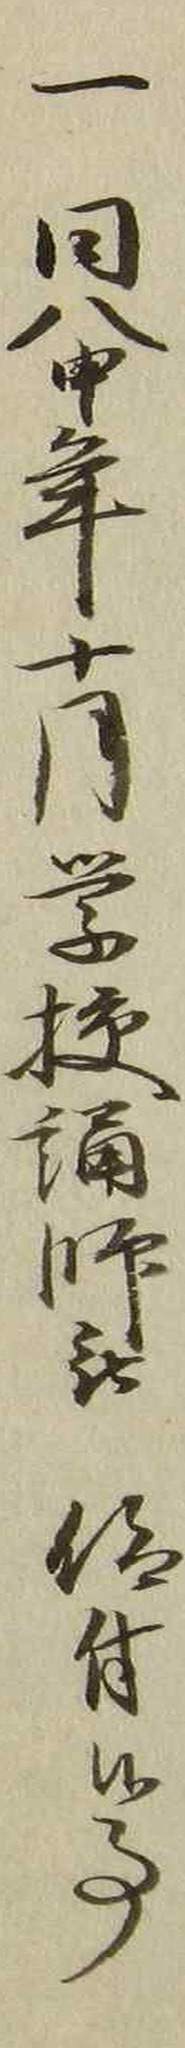一同八申年十月学校誦師被仰付候事
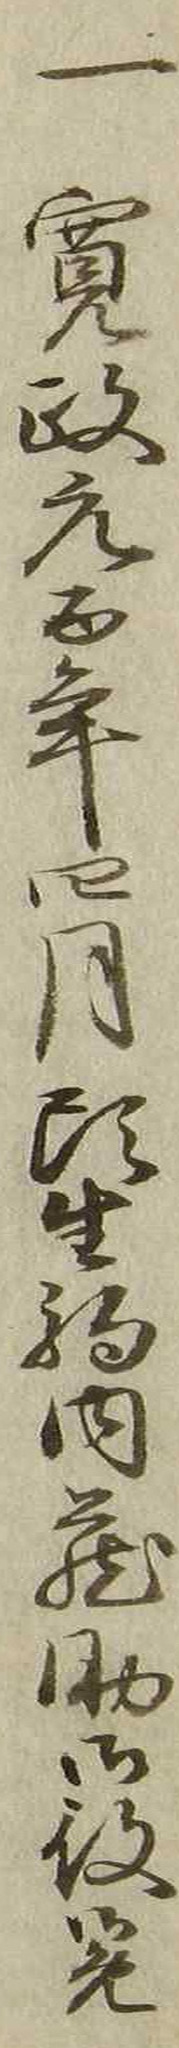一寛政元酉年四月頭生駒内蔵助御役御免
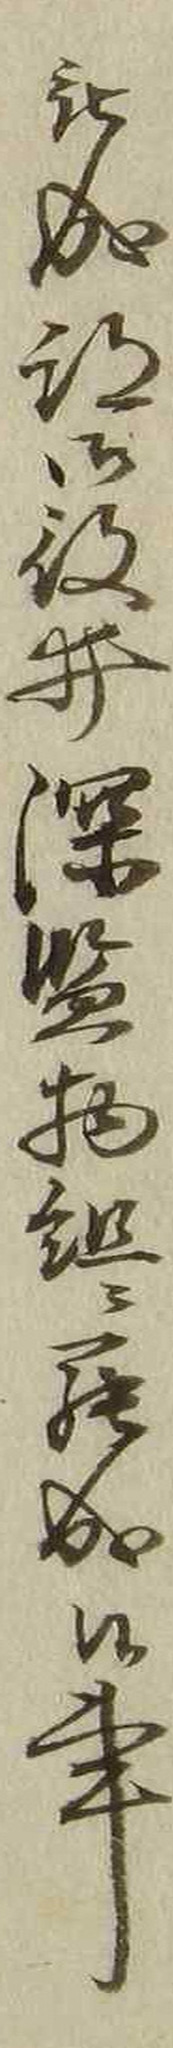被成跡御役井深監物組ニ罷成候事
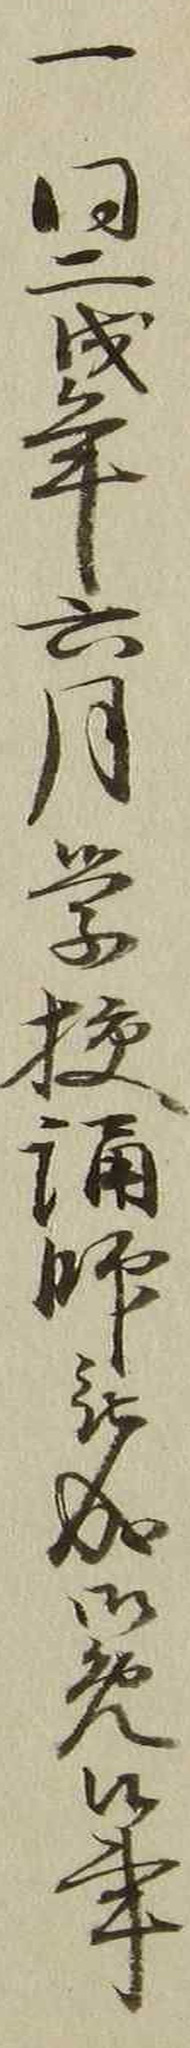一同ニ戌年六月学校誦師被成御免候事
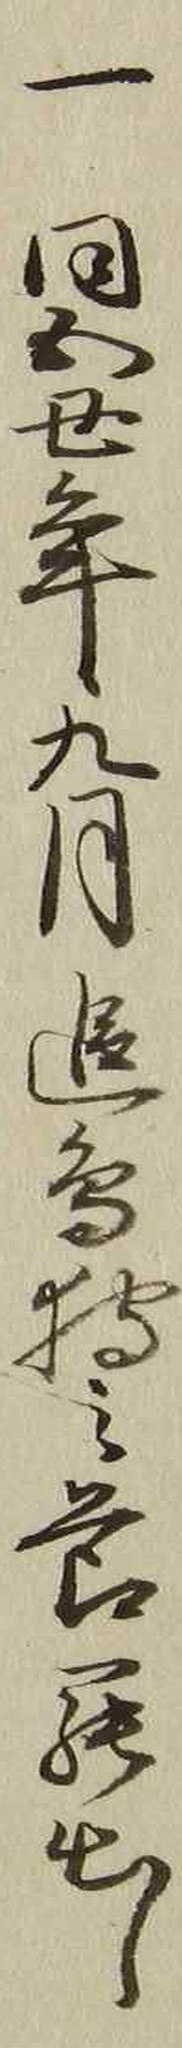一同五丑年九月追鳥狩之節罷出候
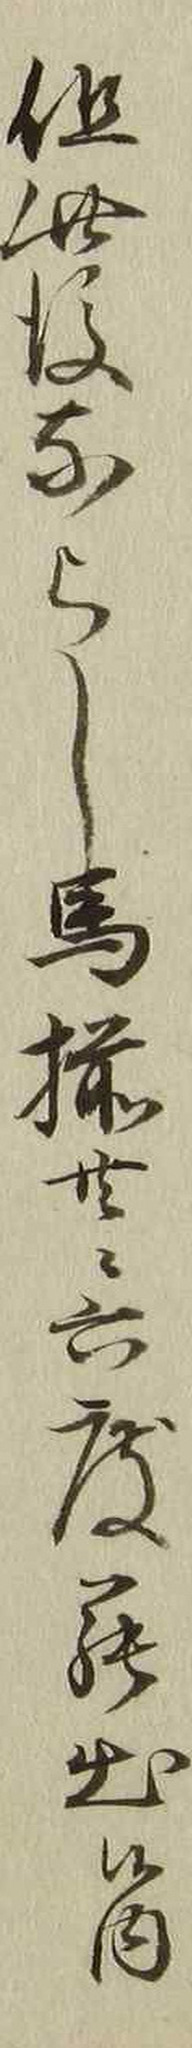但此後ならし馬揃共ニ六度罷出候内
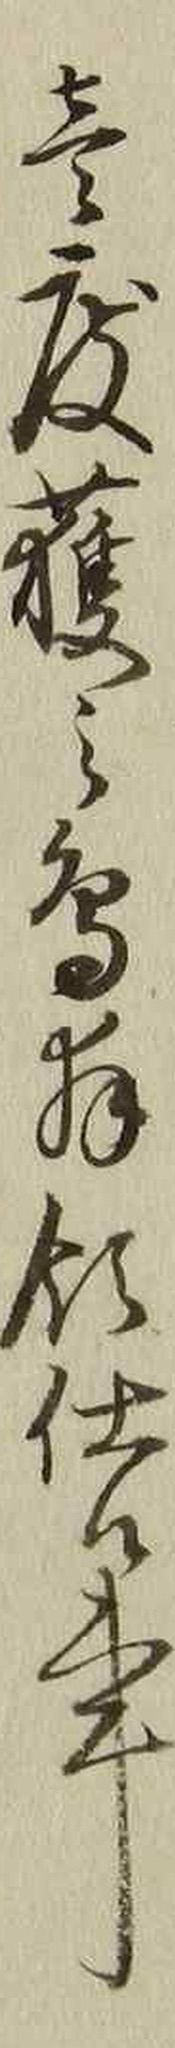壱度獲之鳥拝領仕候事
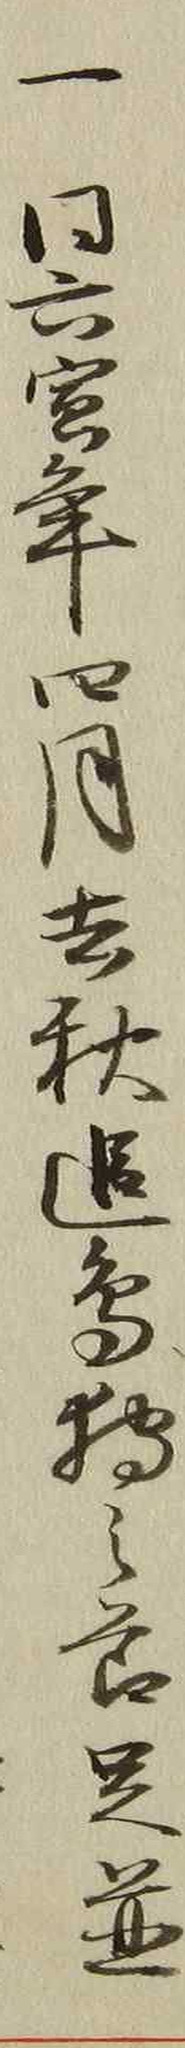一同六寅年四月去秋追鳥狩之節足並
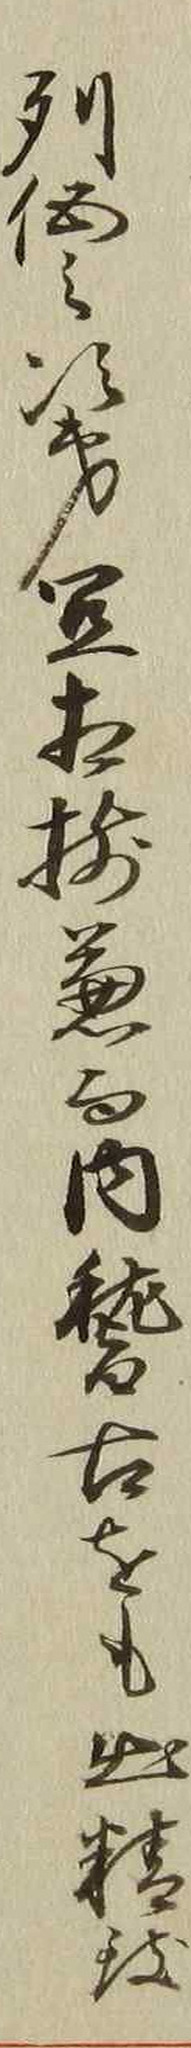列伍之次第相揃兼而内稽古をも出精致
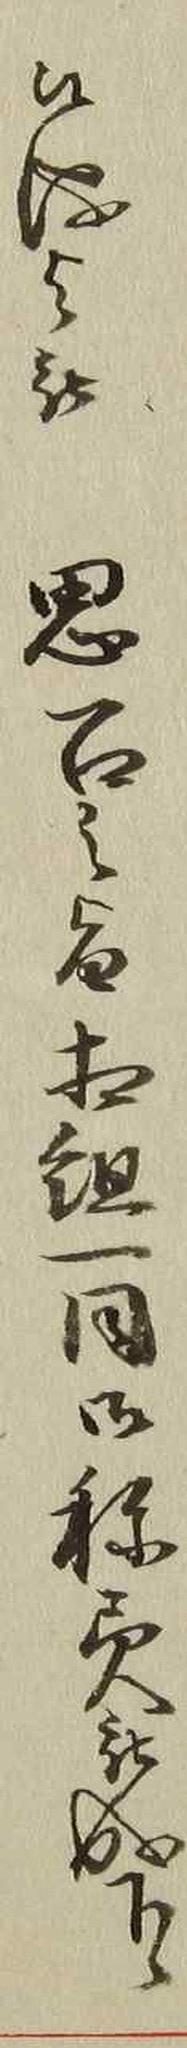候儀与被思召之旨相組一同御称美被成下候
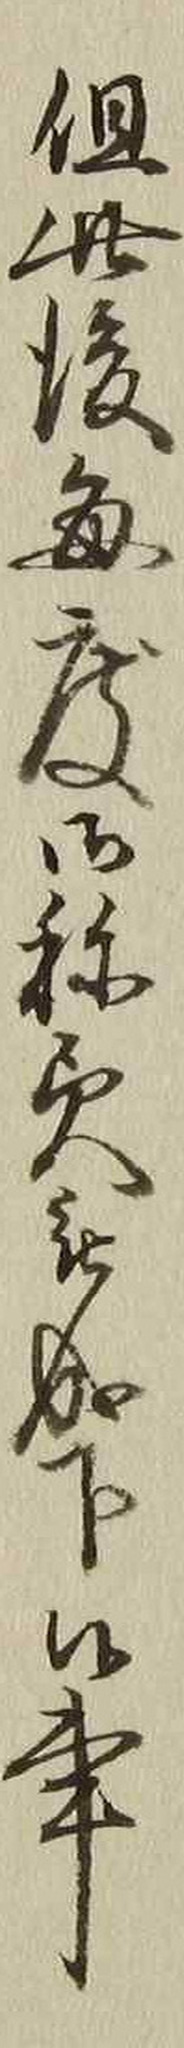但此後毎度御称美被成下候事
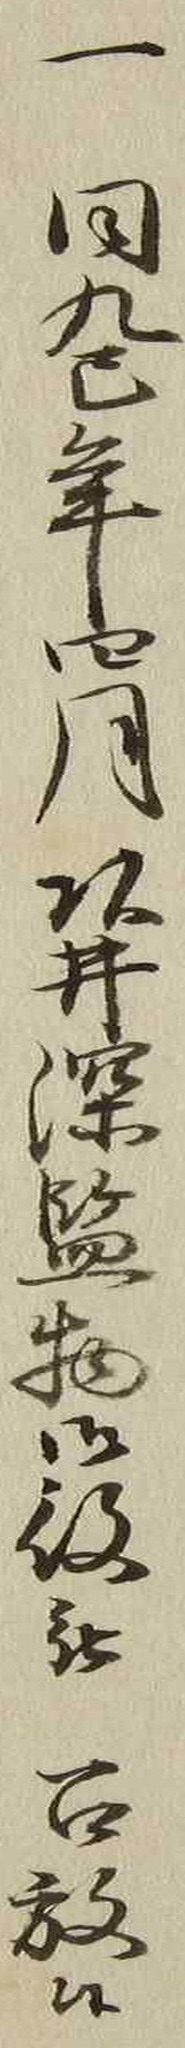一同九巳年四月頭井深監物御役被召放候
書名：諸士系譜　巻之114　か之部22
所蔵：会津若松市立会津図書館
